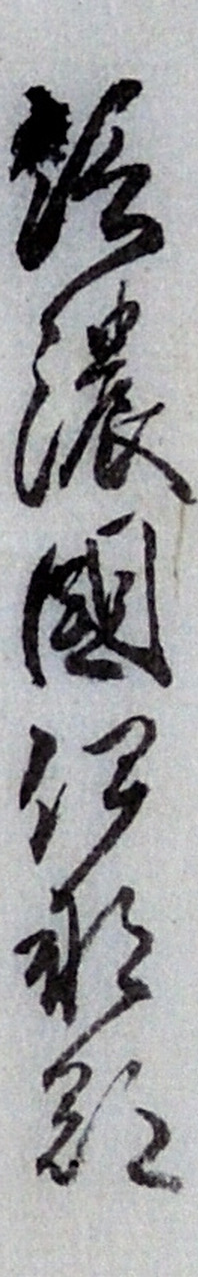信濃国伊那郡
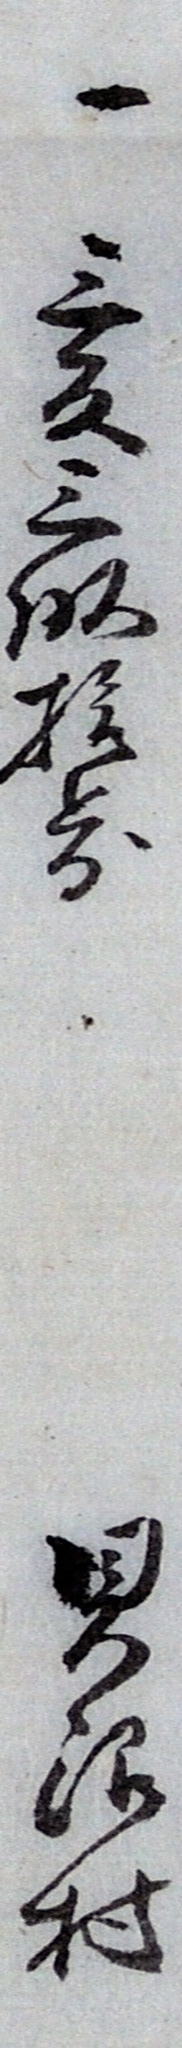一三反三㽗拾歩貝沼村
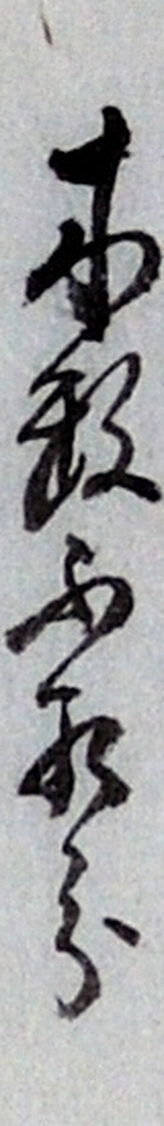木数不相分
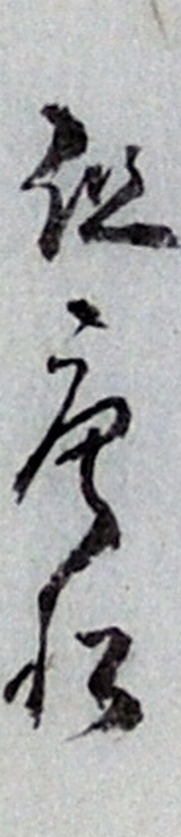但唐松
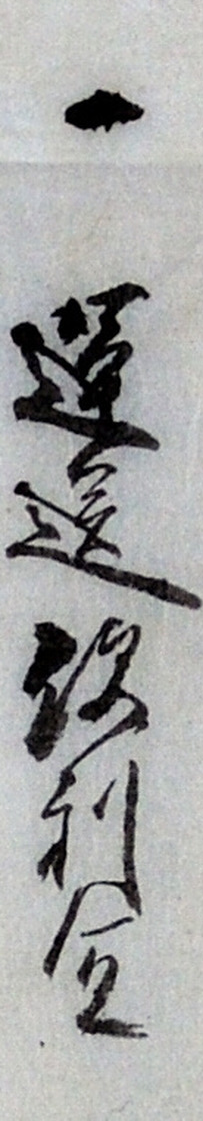一運送便利宜
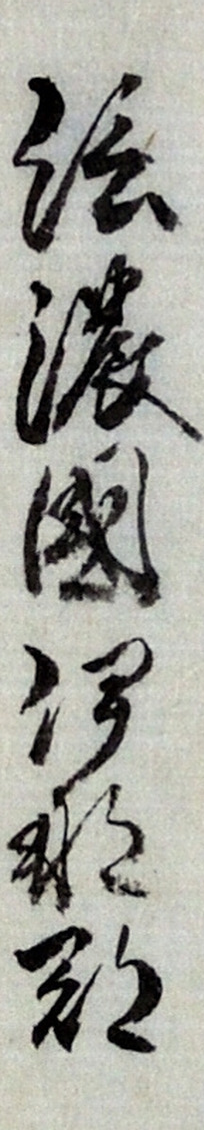信濃国伊那郡
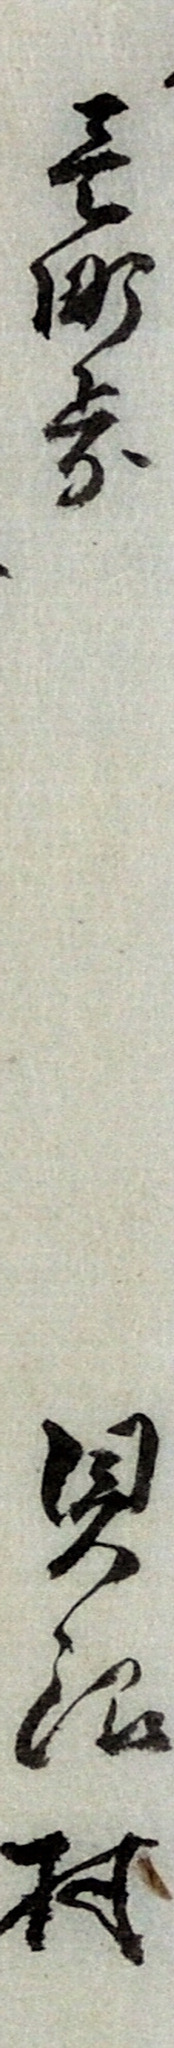一壱町歩貝沼村
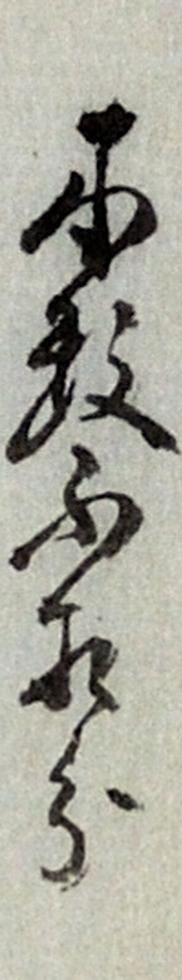木数不相分
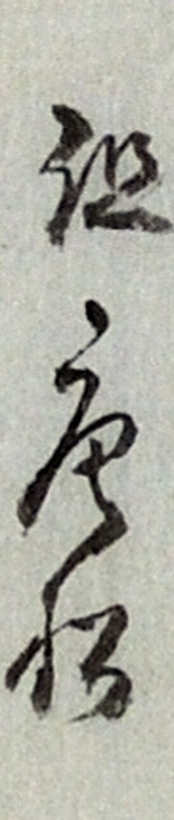但唐松
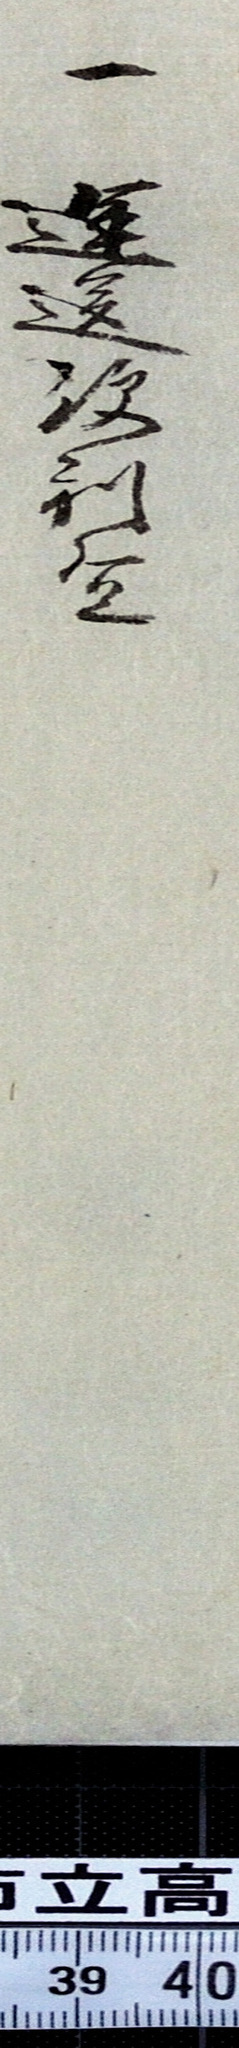一運送便利宜
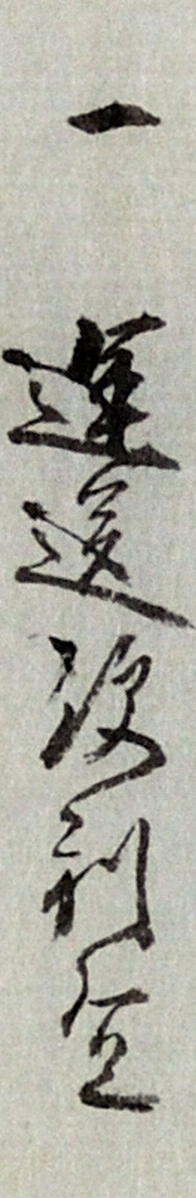一運送便利宜

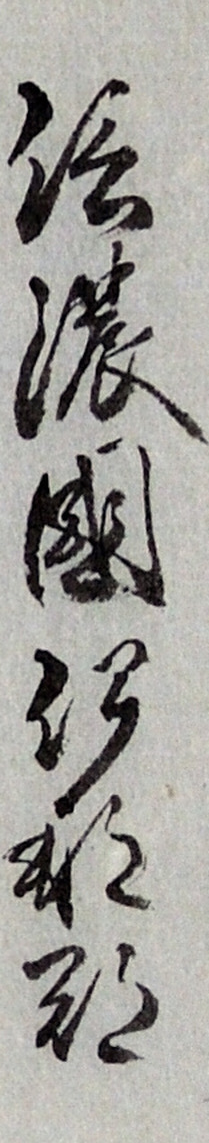信濃国伊那郡
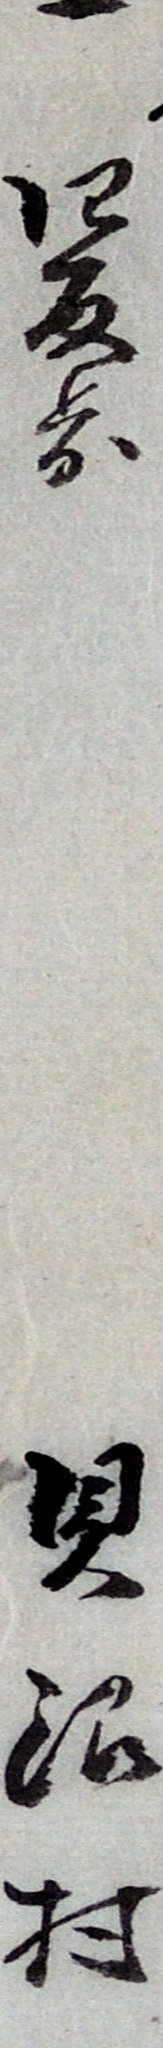一四反歩貝沼村
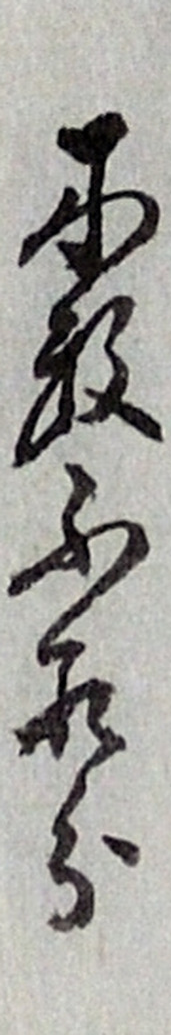木数不相分
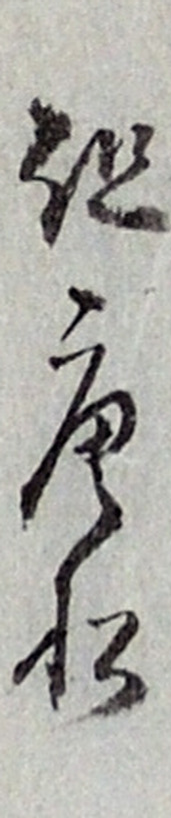但唐松
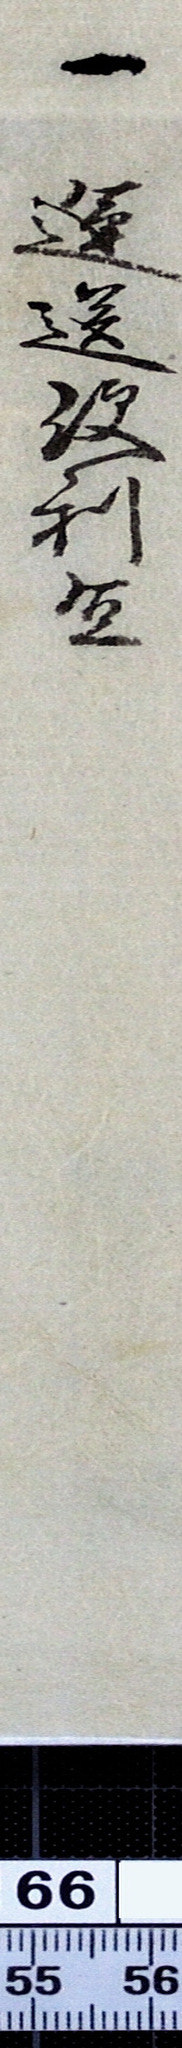一運送便利宜
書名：官林反別帳
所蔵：伊那市立高遠町図書館・合同会社AMANE
